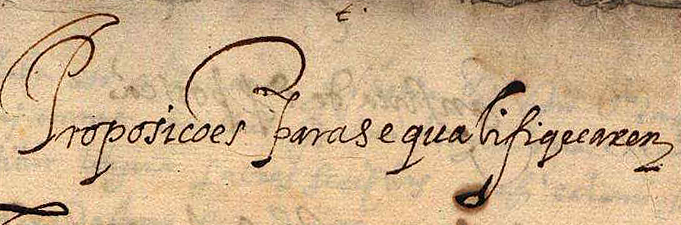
Proposições para se qualifiquarem
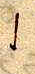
1
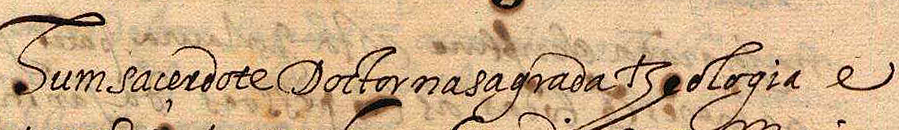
hum sacerdote Doctor na sagrada Theologia e
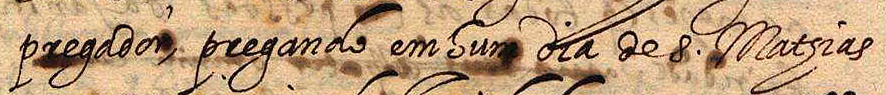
pregador, pregando em hum dia de s. Mathias
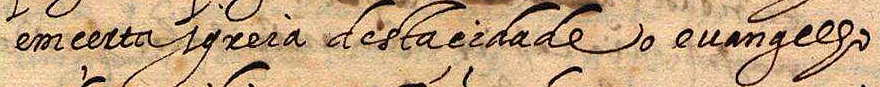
em certa igreia desta cidade o euangelho
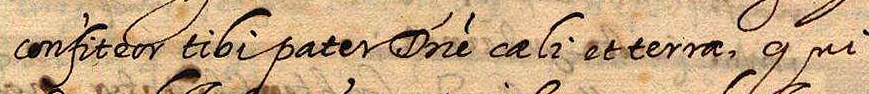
confiteor tibi pater Dnē cæli et terra, qui
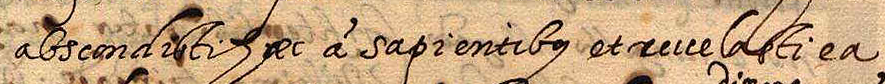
abscondisti hæc á sapientibꝯ et reuelasti ea
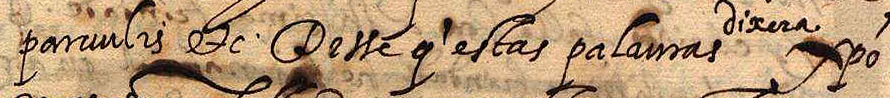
paruulis &c Disse q̄ estas palauras dixera Xpō
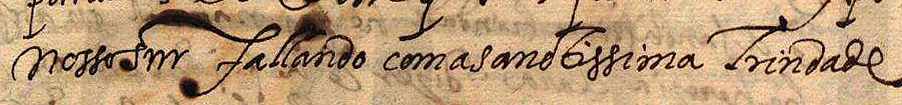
nosso s̄nr fallando com a sanctissima Trindade
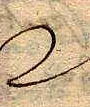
2
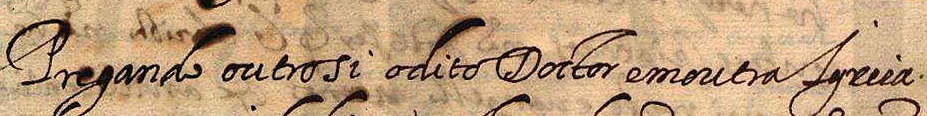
Pregando outrosi o dito Doctor em outra Igreia
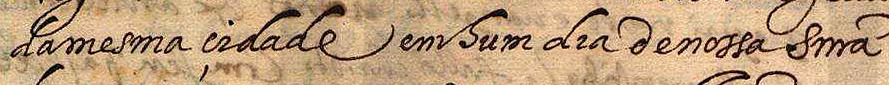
da mesma cidade em hum dia de nossa Snrā
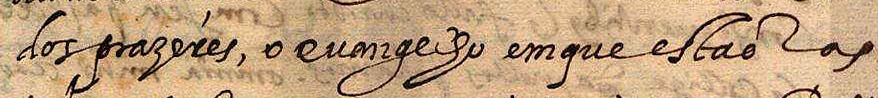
dos prazeres, o euangelho em que estaõ as
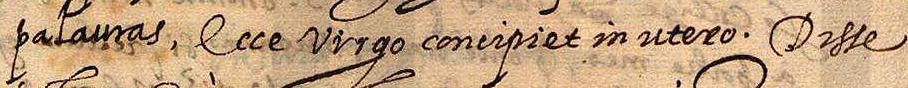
palauras, Ecce virgo concipiet in utero. Disse
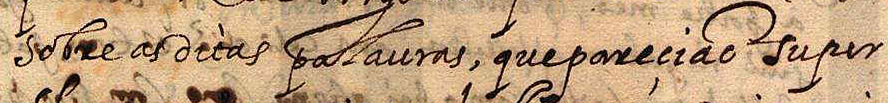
sobre as ditas palauras, que pareciaõ super
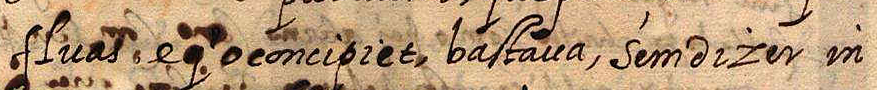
fluas e q̄ o concipiet, bastaua, sem dizer in
